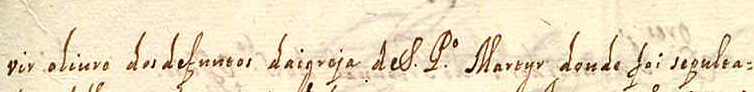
vir o liuro dos defuntos da igreja de S. P.o Martyr donde foi sepulta
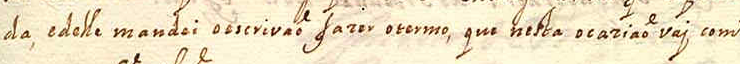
da, e delle mandei o escrivaõ fazer o termo, que nesta ocaziaõ vaj com
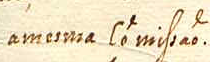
a mesma Cōmissaõ.
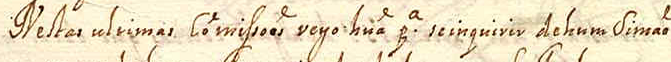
Nestas ultimas Cōmissoẽs veyo huā p.a se inquirir de hum Simaõ
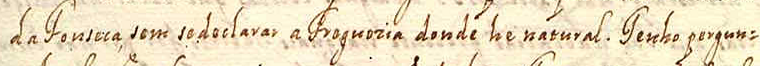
da Fonseca, sem se declarar a Freguezia donde he natural. Tenho pergun
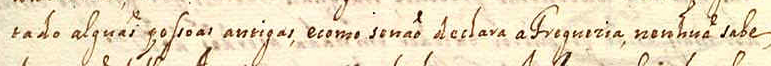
tado alguās pessoas antigas, e como senaõ declara a Freguezia, nenhuā sabe
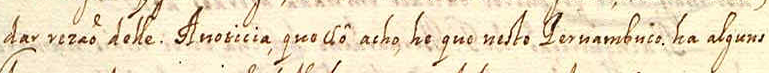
dar rezaõ delle. A noticia, que sô acho, he que neste Pernambuco ha alguns
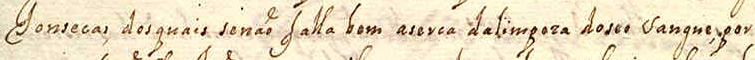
Fonsecas, dos quais se não falla bem aserca da limpeza do seo sangue, por
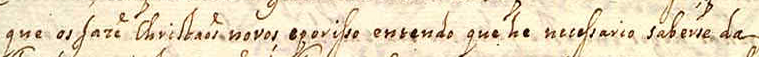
que os fazē Christaõs novos, e por isso entendo que he necessario saberse da
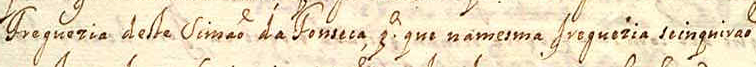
Freguezia deste Simaõ da Fonseca, p.a que na mesma freguezia se inquiraõ
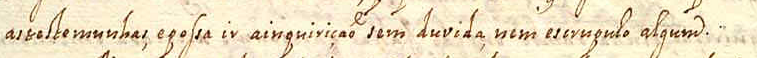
as testemunhas, e possa ir a inquiriçaõ sem duvida, nem escrupulo algum.
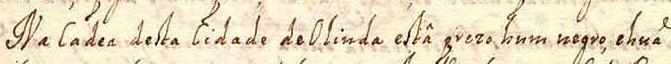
Na Cadea desta Cidade de Olinda está prezo hum negro, e huā
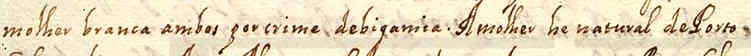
molher branca ambos por crime de bigamia. A molher he natural de Porto
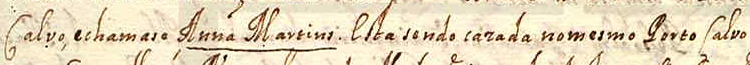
Calvo, e chamase Anna Martins. Esta sendo cazada no mesmo Porto Calvo
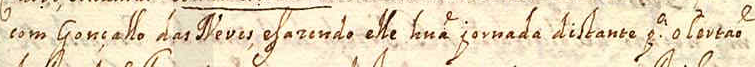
com Gonçallo das Neves, e fazendo elle huā jornada distante p.a o Certaõ
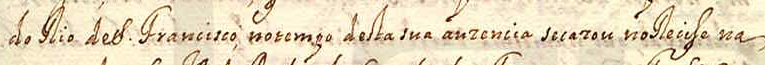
do Rio de S. Francisco, no tempo desta sua auzencia se cazou no Recife na
